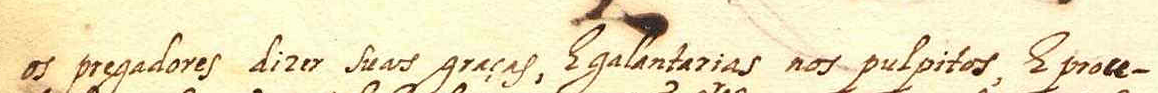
os pregadores dizer suas graças, E galantarias nos pulpitos, E proce
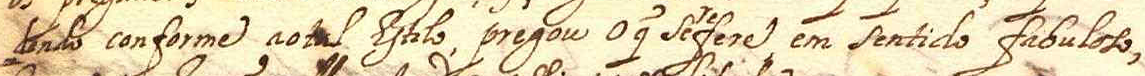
dendo conforme ao tal Estilo, pregou o q̄ se refere em sentido fabuloso,
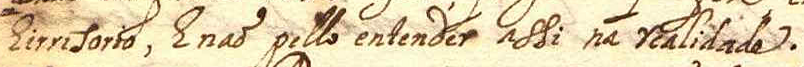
E irrisorio, E naõ pello entender assi na realidade.
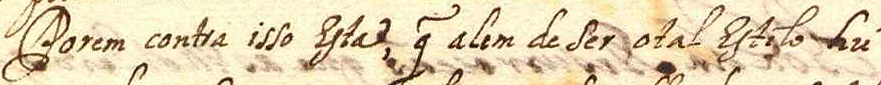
Porem contra isso Esta, q̄ alem de ser o tal Estilo hū
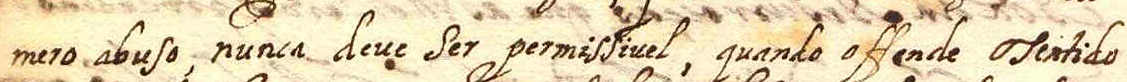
mero abuso, nunca deue ser permissiuel, quando offende o sentido
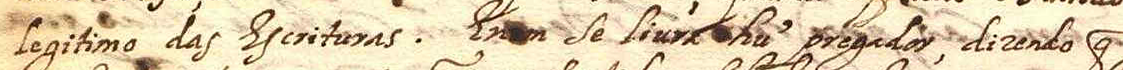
legitimo das Escrituras. E nem se liura hū pregador, dizendo q̄
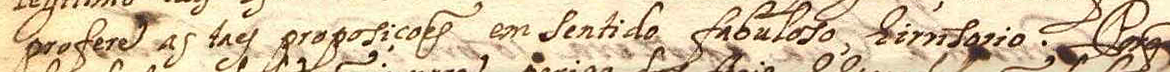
profere as taes proposiçoẽs em sentido fabuloso, E irrisorio. Porq̄
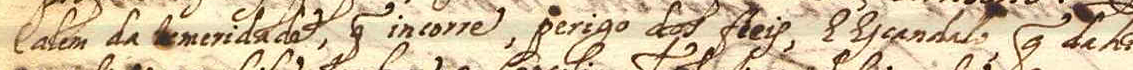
alem da temeridade, q̄ incorre, perigo dos fieis, E Escandalo, q̄ dahi
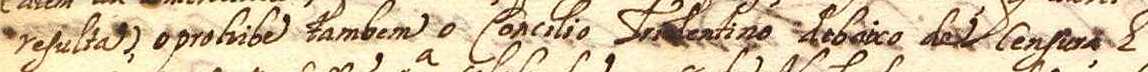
resulta, o prohibe tambem o Concilio Tridentino debaixo de Censura, E
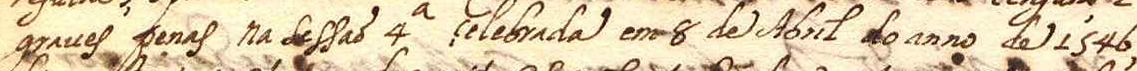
graues penas na sessaõ 4a celebrada em 8 de Abril do anno de 1546,
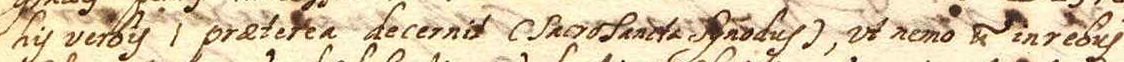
his verbis / præterea decernit (sacrosancta synodus), vi nemo ū in rebus
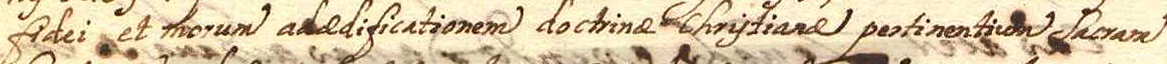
fidei et morum a dædificationem doctrinæ christianæ pertinentium Sacrarā
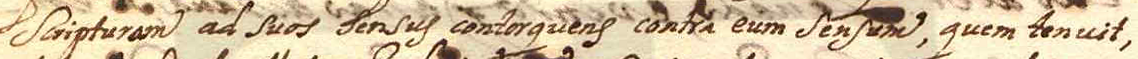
Scripturam ad suos sensus contorquens contra eum sensum, quem tenuit,
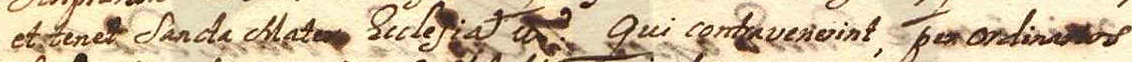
et tenet Santa Mater Ecclesia ū qui contravenerint, per ordinarios
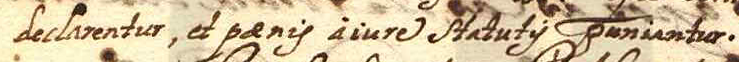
declarentur, et pænis a iure statutis punientur.
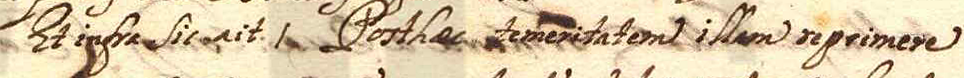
Et infra sic ait / Posthæ temeritatem illam reprimere
